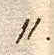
11.
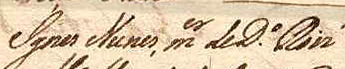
Ignes Nunes, mer de D.o Roiz̄
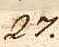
27.
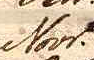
Novr.o
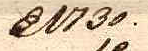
d̄ 1730.
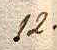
12.
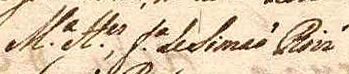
M.a H.es, f.a de Simaõ Roiz̄
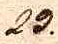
29.
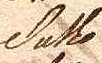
Iulho
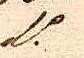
d.o
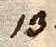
13.
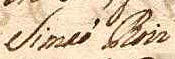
Simaõ Roiz̄
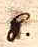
8.
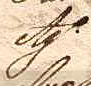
Ag.o
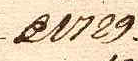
d̄ 1729
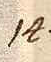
14.
